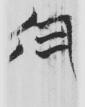今
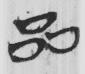厽
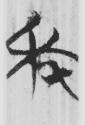年
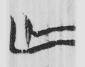亡
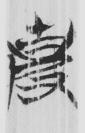尅
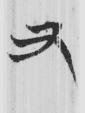又
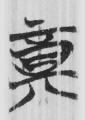奠
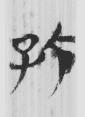孤
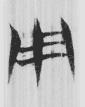用
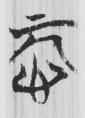{元心}
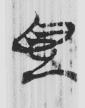見
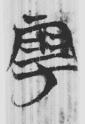𩁹
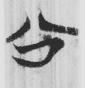公
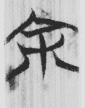余
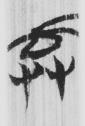弃
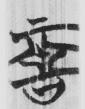{亞口}
